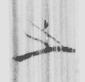之
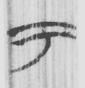于
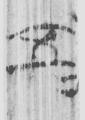五=
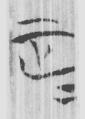正=
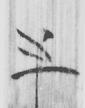之
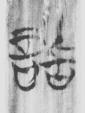詣
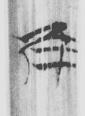隹
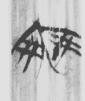爽
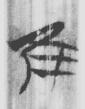隹
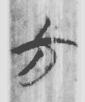方
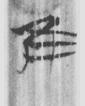隹
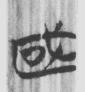國
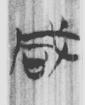咸
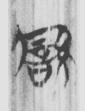{人言系}
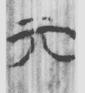亓
